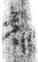不
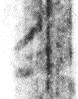㠯（以）
